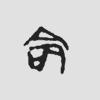命
